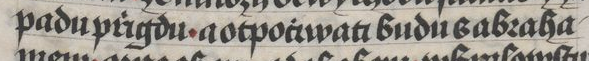padu pṙigdu.a otpoċiwati budu s abraha¬
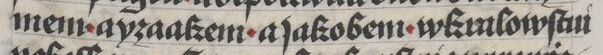mem.a yzakem.a Iakobem.wkralowſtui
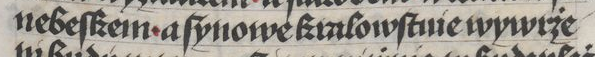nebeſkem.a ſynowe kralowſtuíe wywrże¬
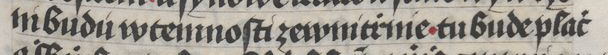ni budú wtemnoſti zewnitṙnie.tu bude plaċ
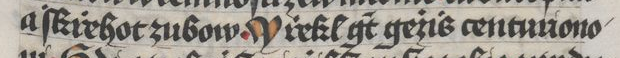a ſkṙehot zubow.Y ṙekl ḡt geżiṡ centuriono¬
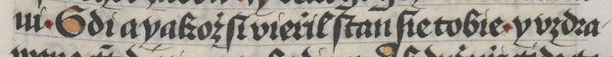ui.Gdi a yakoż ſi vieṙil ſtan ſie tobie.y vzdra¬
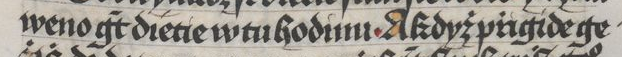weno ḡt dietie wtu hodinu.Akdyż pṙigide ge¬
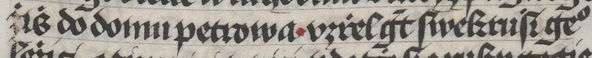żiṡ do domu petrowa.vzṙel ḡt ſwekruẛi ḡeo
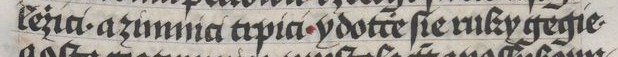leżící a zimnicí trpící.ydotċe ſie ruky gegíe.
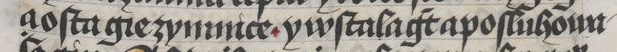aoſta gie zymnice.ywſtala ḡt poſluhowa¬
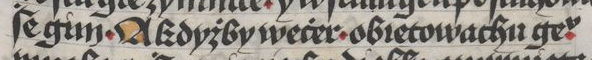ẛe gim.A kdyżby weċer.obietowachu gev.
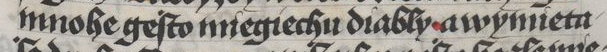mnohe geẛto miegíechu diably.a wymieta¬
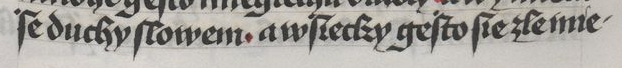ẛe duchy ſlowem.a wẛiecky geẛto ſie zle mie¬
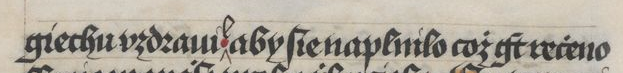giechu vzdrauil.aby ſie naplnilo coż ḡt reċeno
